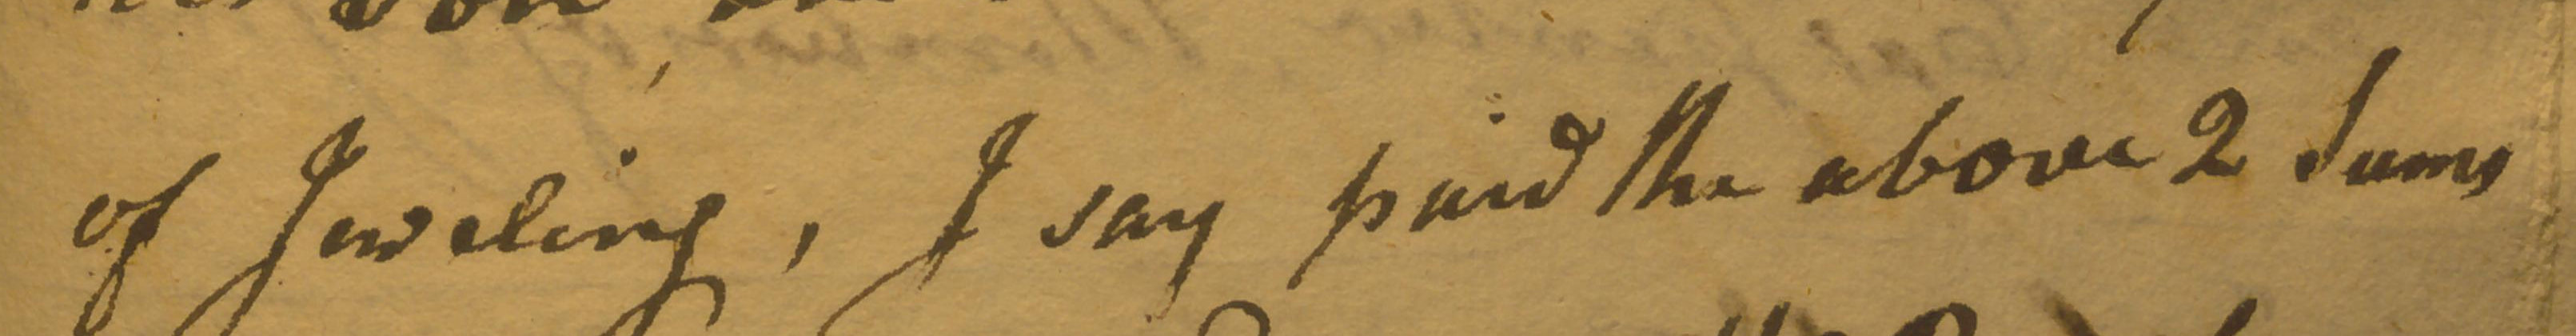of Jeweling, I say paid the above 2 Sums
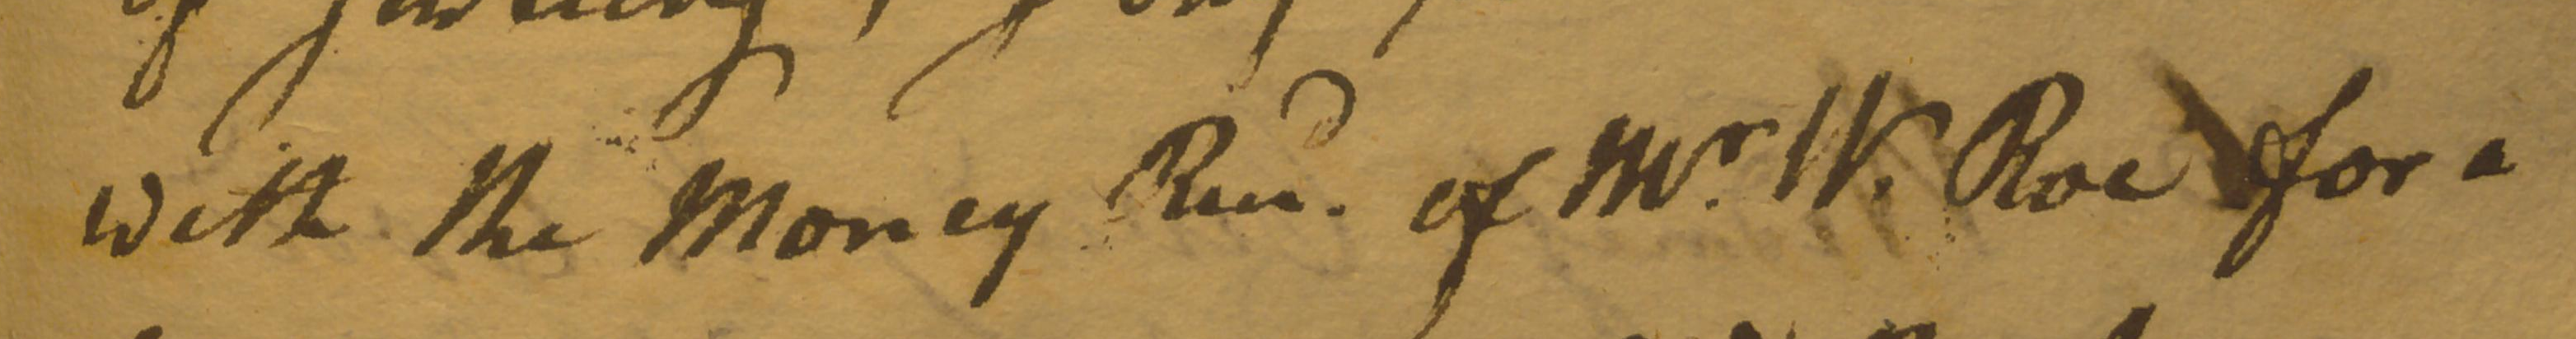with the Money Rec^d. of M^r. W. Roe for a
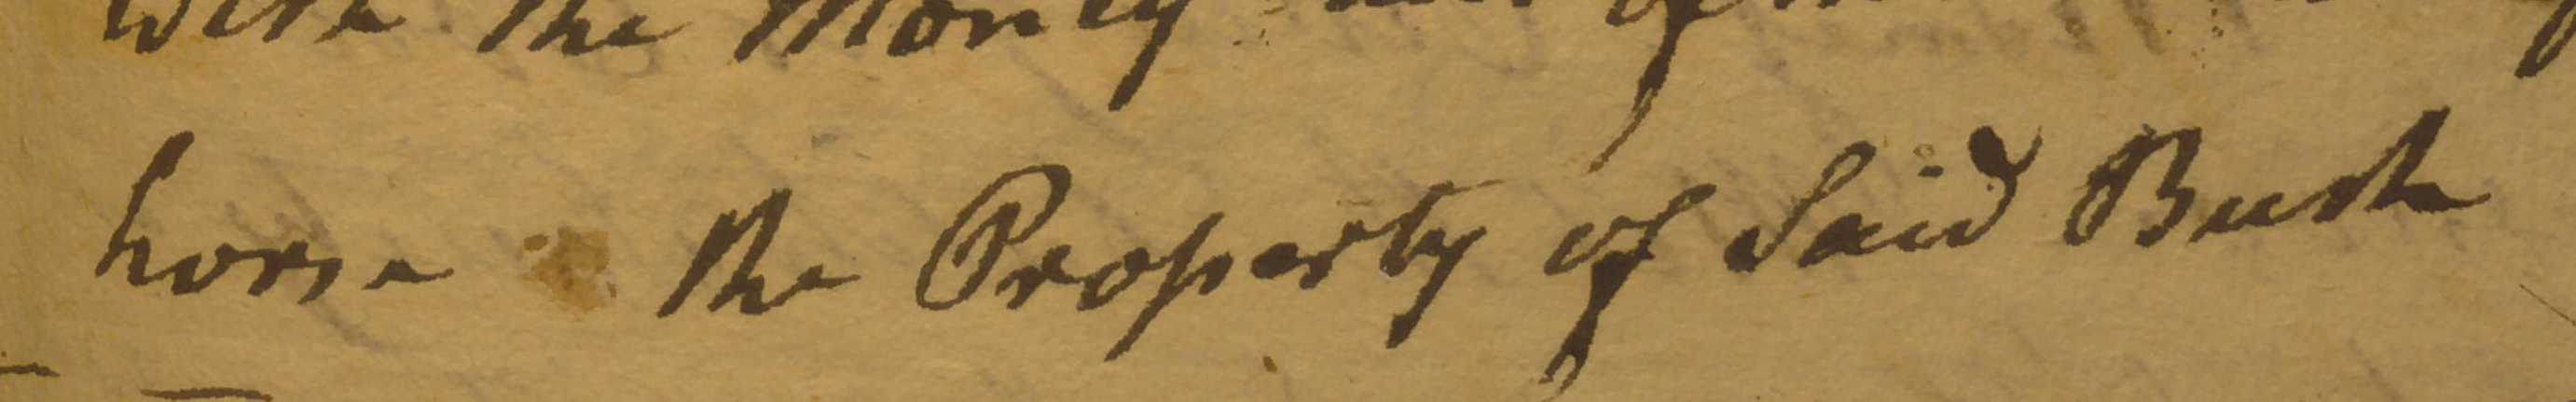horse the Property of Said Bush
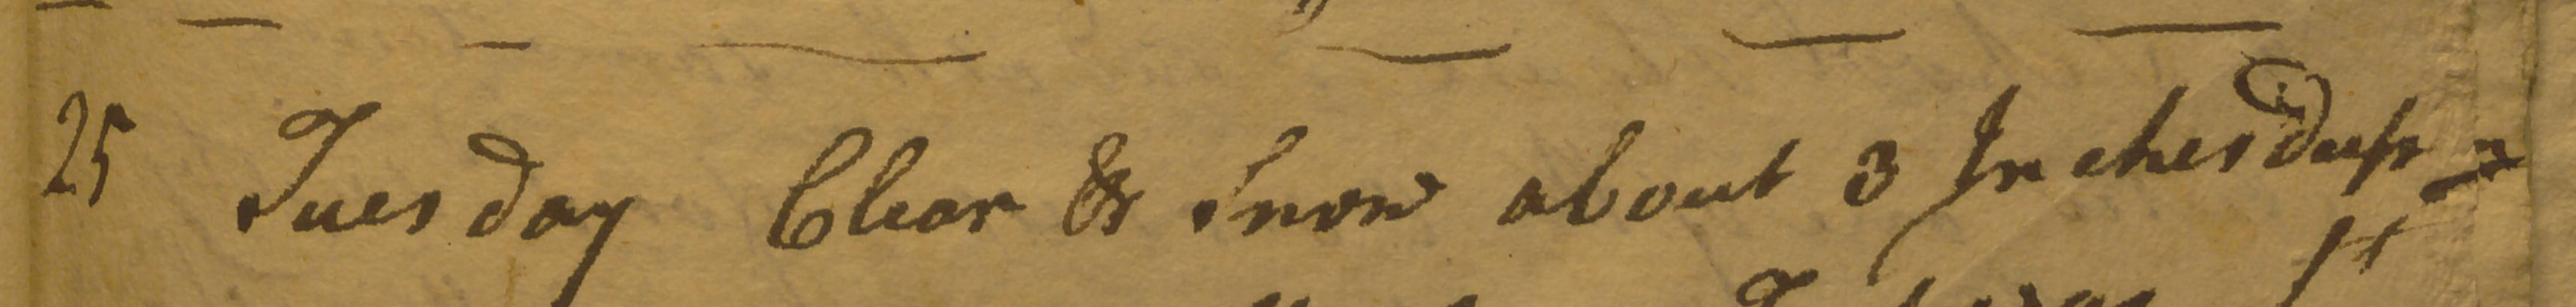25 Tuesday Clear & snow about 3 Inches deep
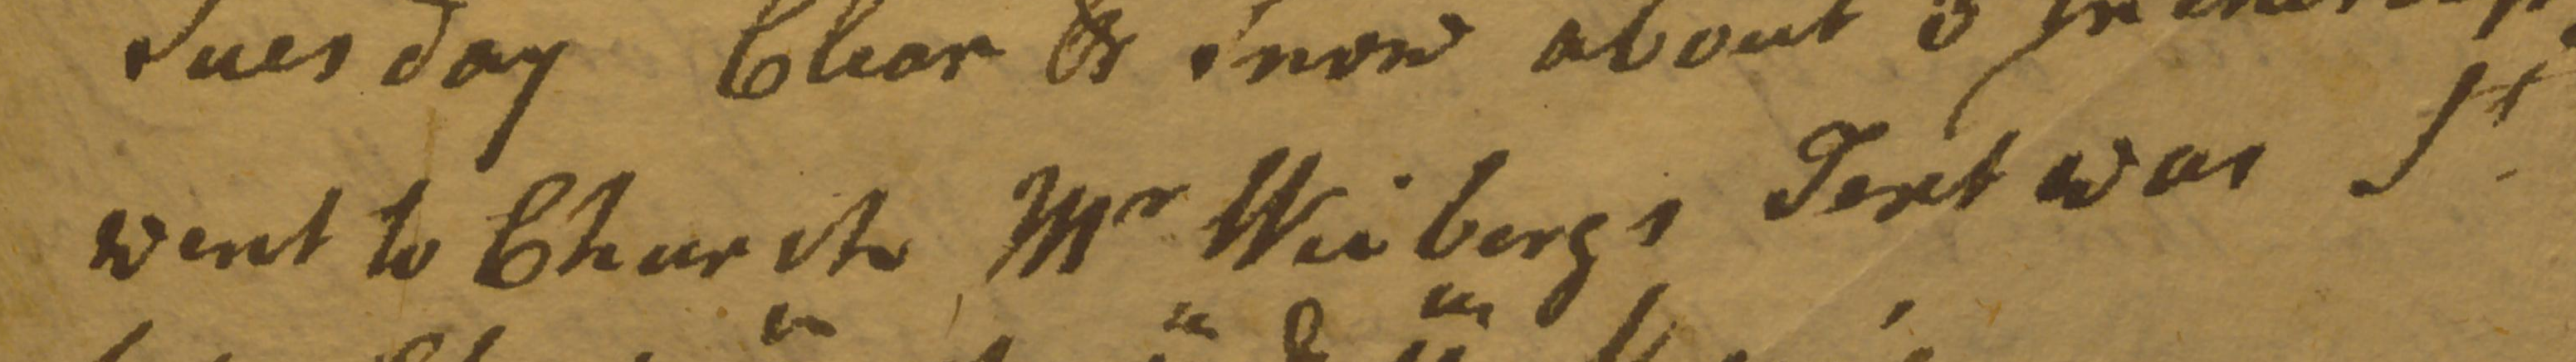went to Church M^r. Weiberg's Text was S^t.
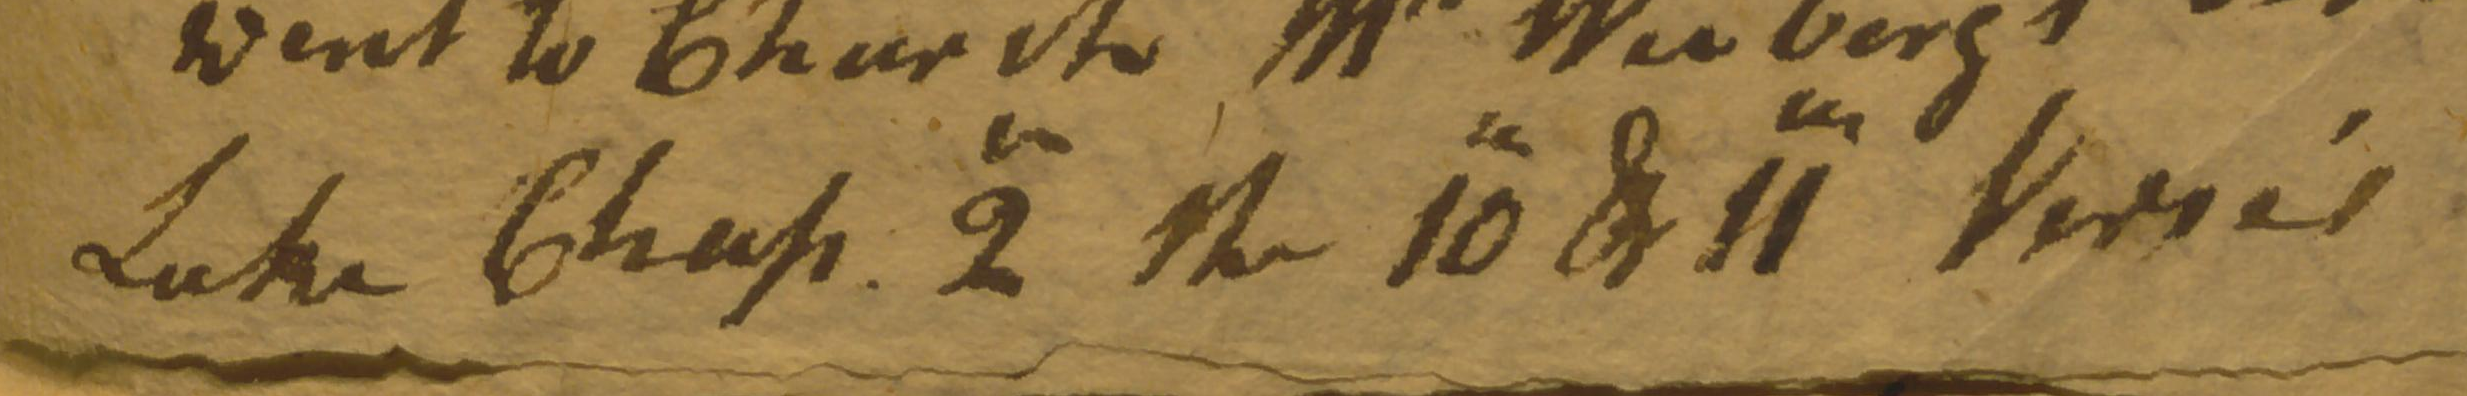Luke Chap. 2^th the 10^th & 11^th Verse's
